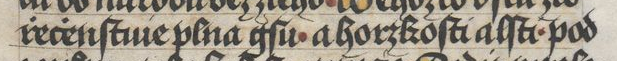ṙeċenſtwie plna gſu.a horzkoſti a lſti.pod
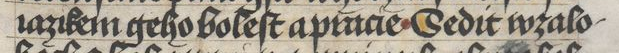iazikem geho boleſt a pracie.Sedit wzalo¬
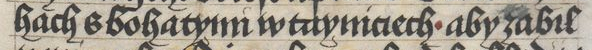hach s bohatymi w tayniciech.aby zabil
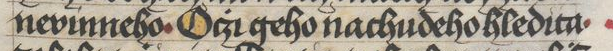nevinneho.Ocżi geho nachudeho hledita.
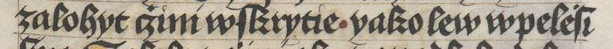zalohyt cżiní wſkrytie.yako lew w peleẛi
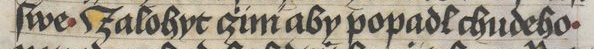ſwe.Zalohyt cżiní aby popadl chudeho.
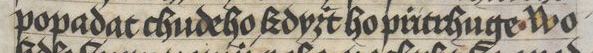popadat chudeho kdyžt ho pṙitrhuge.Wo¬
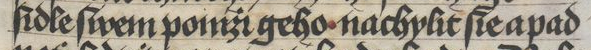ſidle ſwem poniżí geho.nachylit ſie a pad¬
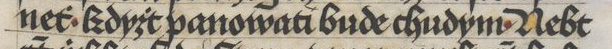neṫ.kdyžt panowati bude chudym.Nebt
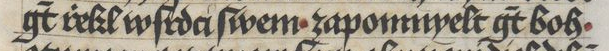ḡt ṙekl wſrdci ſwem.zapomnyelt ḡt boh.
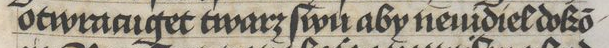otporacuget twarz ſwu aby nevidiel dokō¬
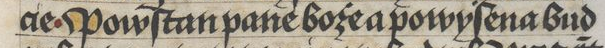cie.Powſtan pane boże a powyẛena bud
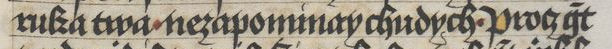ruka twa.nezapominay chudych.Procz ḡt
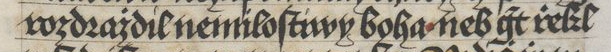rozdrażdil nemiloſtiwy boha.neb ḡt ṙekl
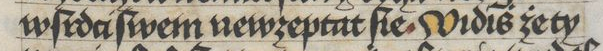wſrdci ſwem newzeptat ſie.Vidiṡ że ty
